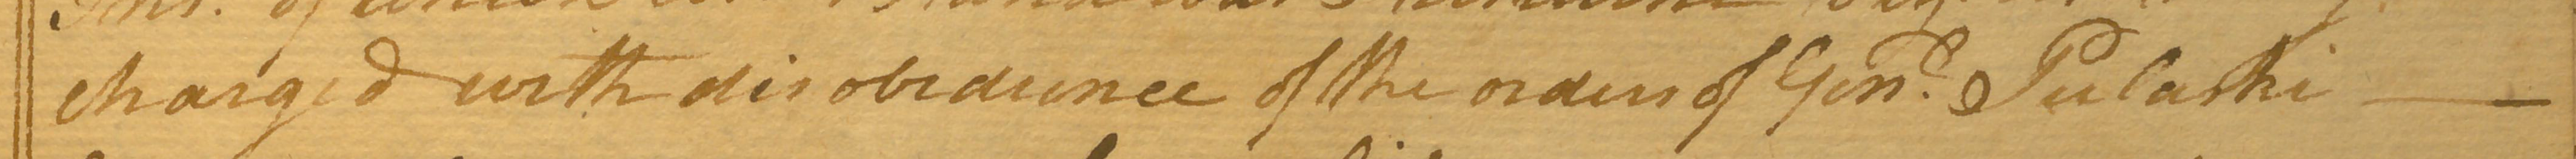charged with disobedience of the orders of Gen^l. Pulaski-
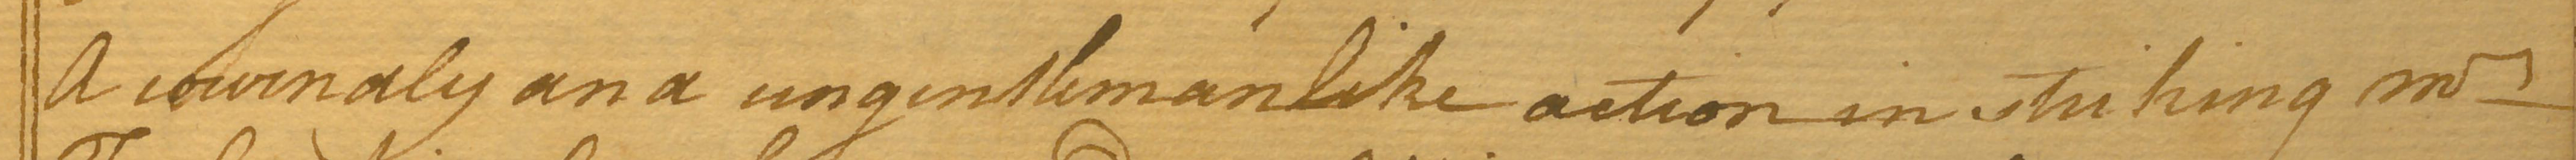A cowardly and ungentlemanlike action in striking M^r
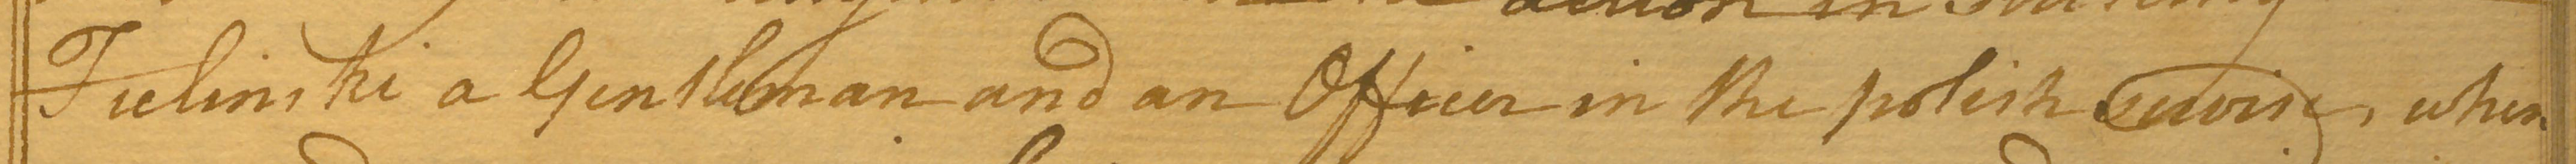Tulinski a Gentleman and an Officer in the polish service, when
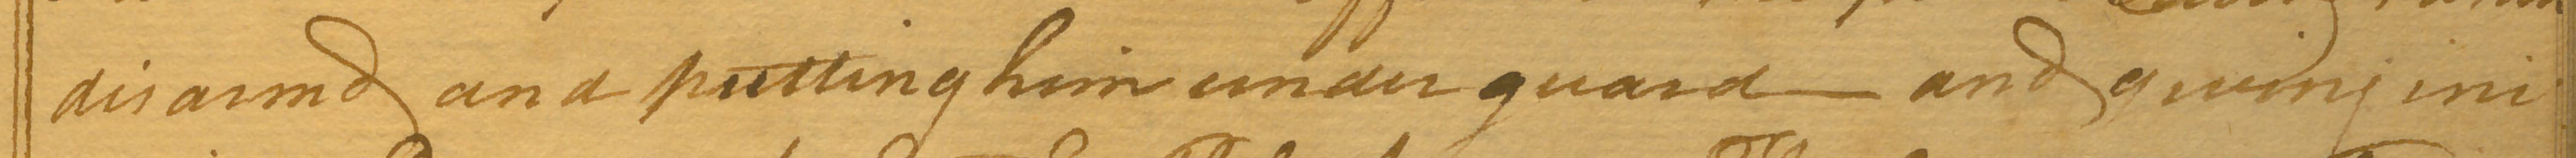disarmd and putting him under guard- and giving imi
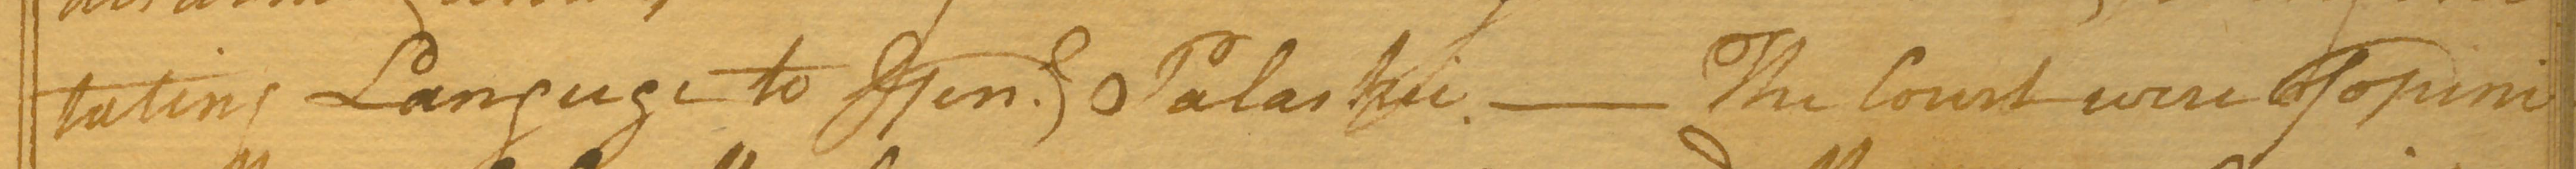tating Language to Gen^l. Pulaski- The Court were of opini
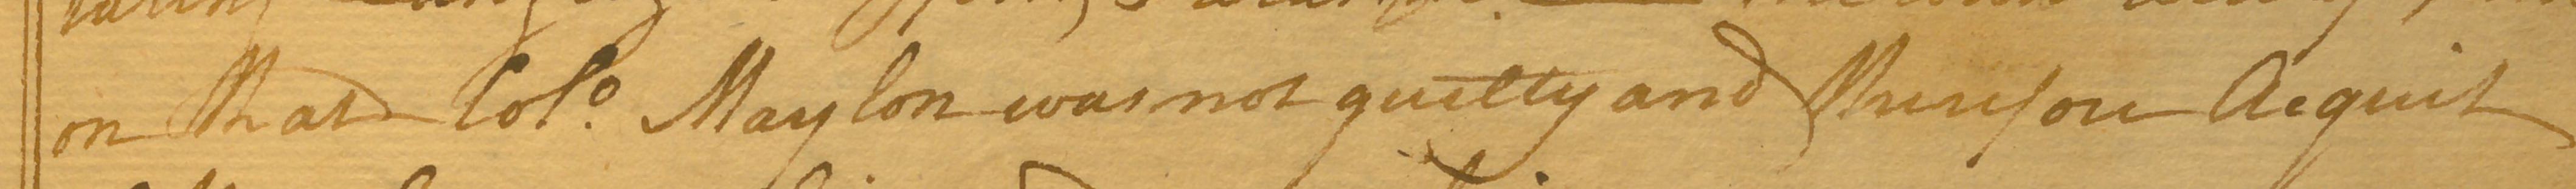on that Col^o. Maylon was not guilty and therefore Acquit
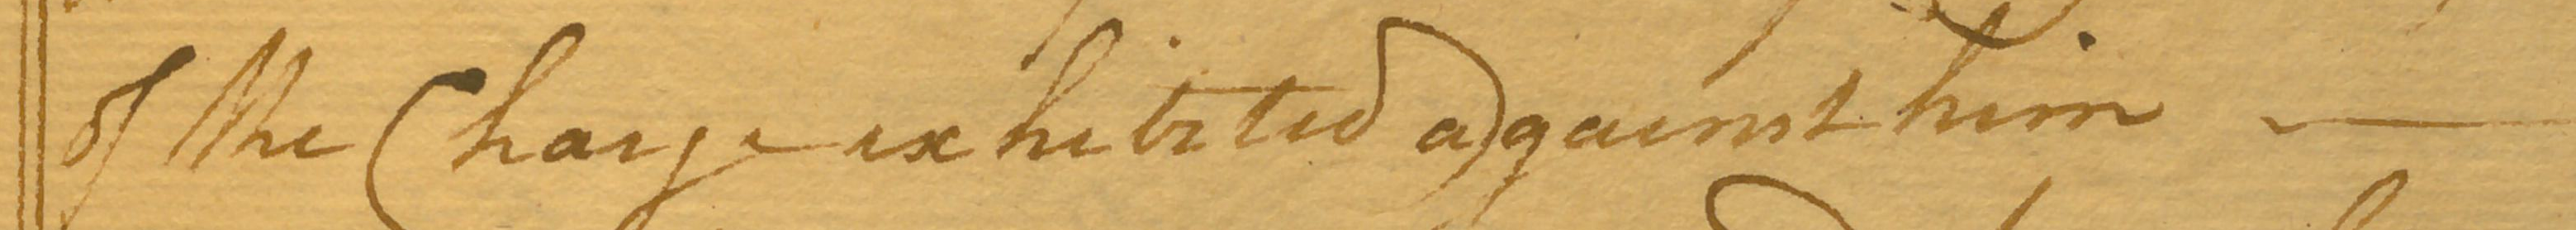of the Charge exhibited against him-
